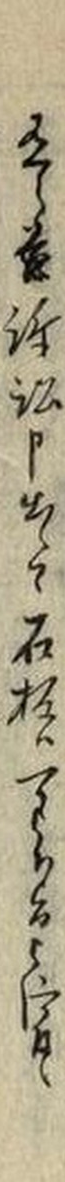有之並訴訟申出候はゝ石板は可被下旨被仰付候
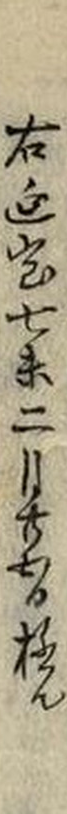右延宝七未二月廿七日極ル
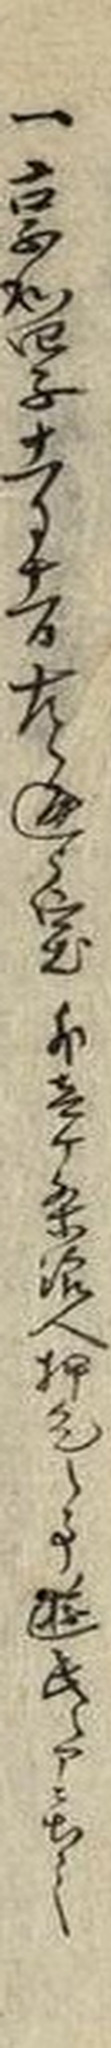一享和四子十一月十一日左之通被仰出外壱ケ条浪人押乞之事遊民之部に出之
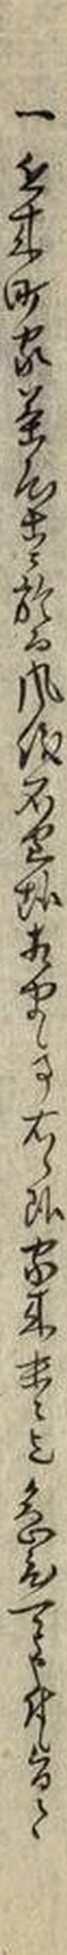一近来町家茶屋等に於て風儀不宜趣相聞候事右之趣家来末々迄急度可被申付旨に候
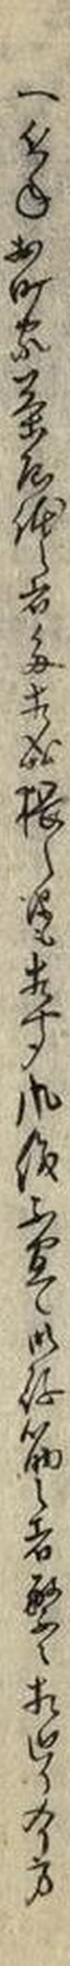一近年於町家茶屋体之者多相成猥之儀も相聞風儀不宜候御役筋之者繁に相廻り〆り方
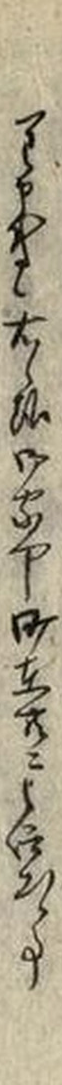可被申付候右之趣御家中町在共に被仰出候事
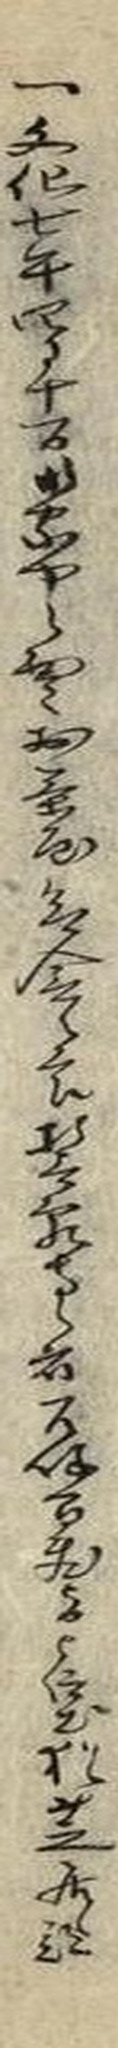一文化七午四月十一日御家中之面々於茶屋会食之節誓願寺之者召呼間敷旨被仰出猶芝居之部
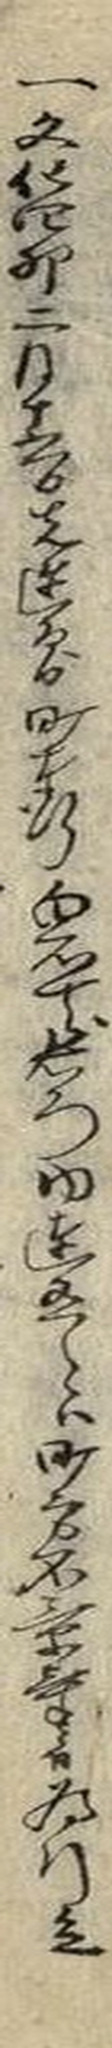一文化四卯二月十六日先達てゟ町奉行白石十郎右衛門内達有之候は町方不景気に付為引立
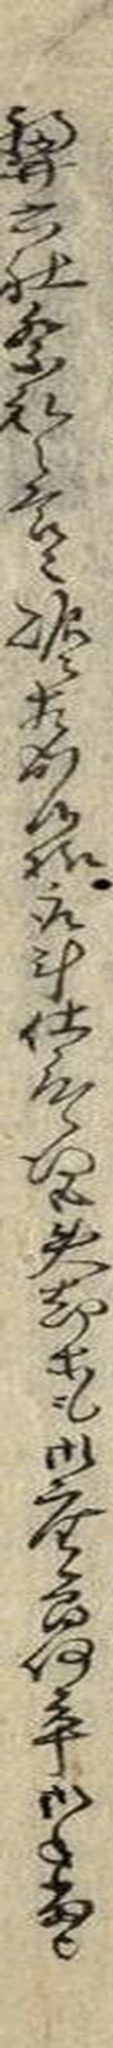福井六社祭礼之節々賑に相成候様取斗仕度候得共失却等も御座候間何卒御手当被
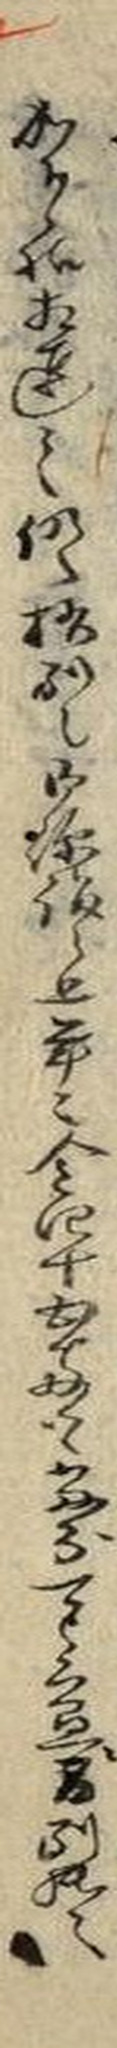成下候様相達之仍之格別之御評議之上年々金四十五両ツヽ当分可被下置候間別帳之

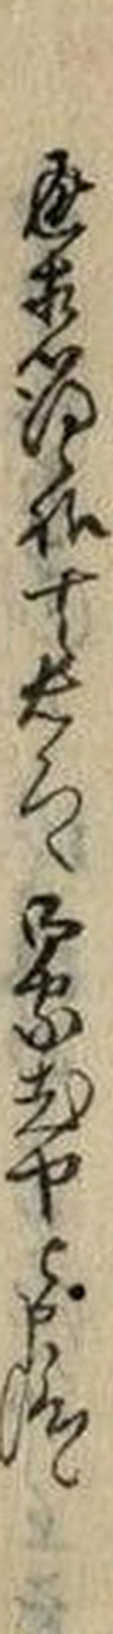通相心得候様十郎右衛門へ御家老中被申渡候
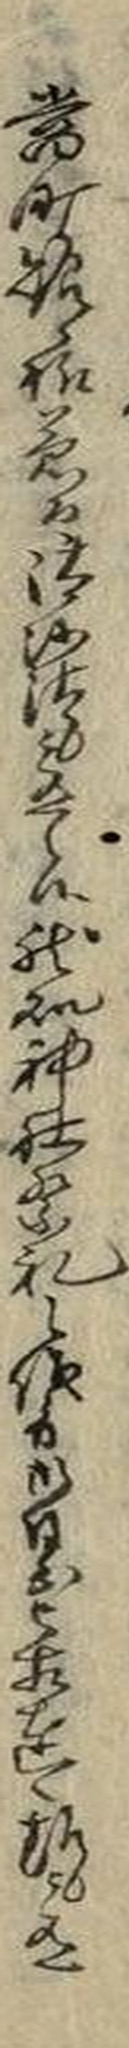当町賑候様兼て御沙汰も有之候然処神社祭礼之儀に付御自分被相達候趣も有
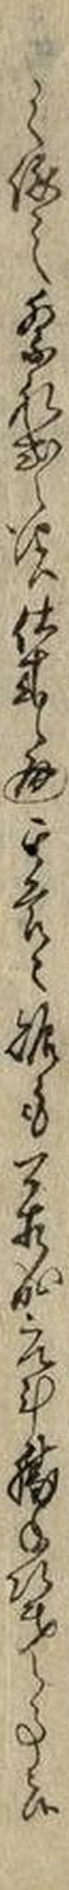之依之祭礼式之儀は仕来之通其節々賑にも可相成取斗勝手次第之事に候
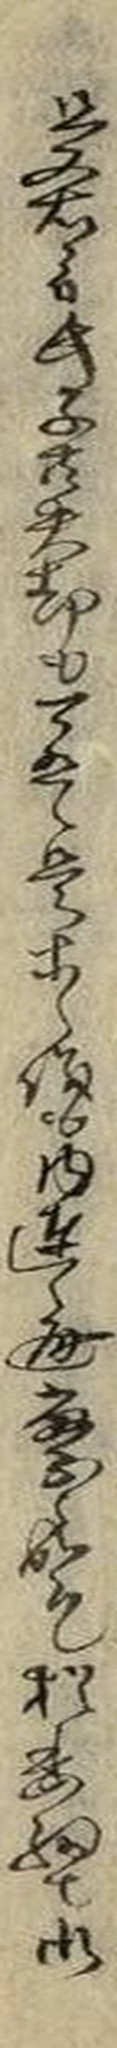且又右に付氏子共失却も可有之是等之儀も内達之通当分被成下候猶委細は御
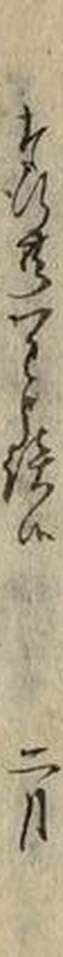奉行共可被申談候二月
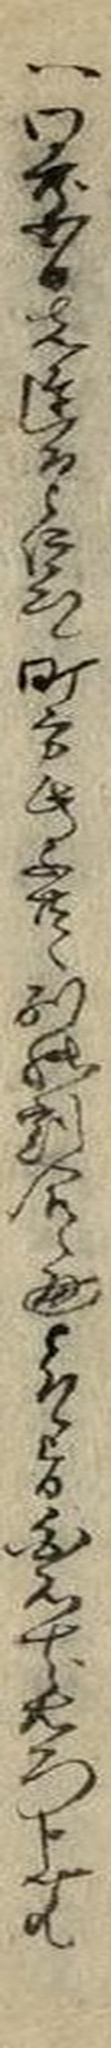一同廿五日先達て被仰出候町方氏子共へ別紙割合之通被下候旨白石十郎右衛門申聞候
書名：御城下諸事之部
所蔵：福井県文書館 Fukui Prefectural Archives
